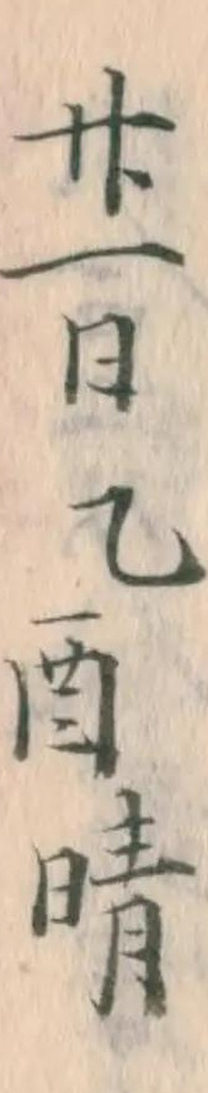廿一日乙酉晴
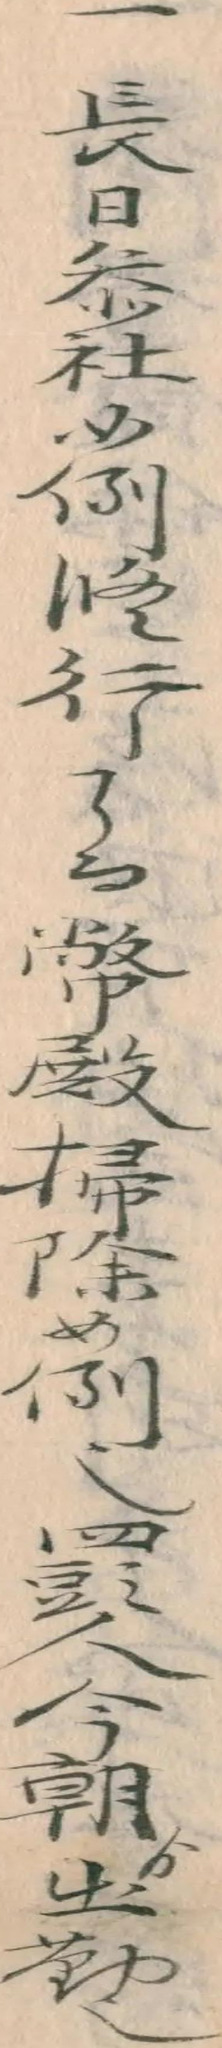一長日参社如例修行了而幣殿掃除如例也四頭人今朝ゟ出勤也
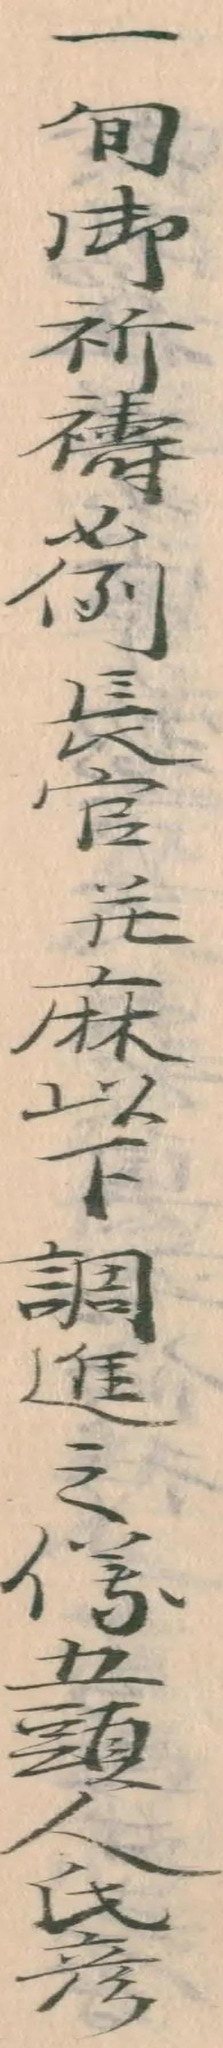一旬御祈祷如例長官并麻以下調進之儀五頭人氏彦
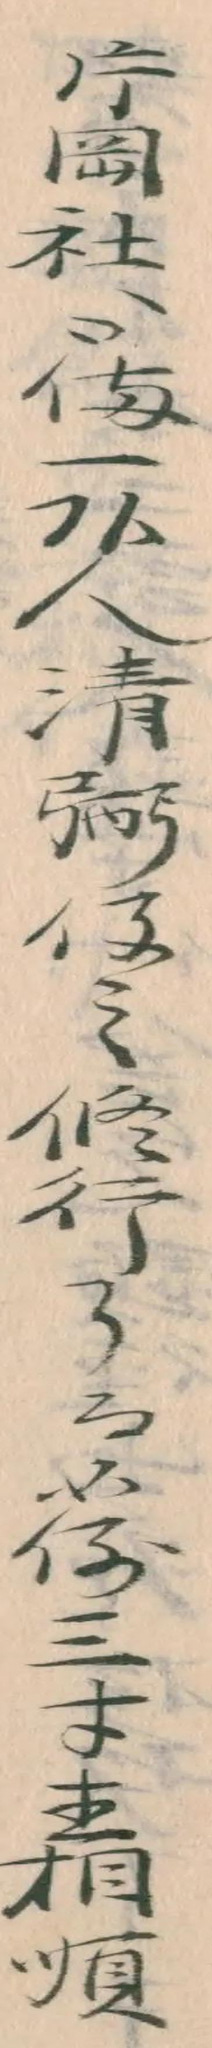片岡社へ御備一頭へ清弼役之修行了而如例三寸直相順
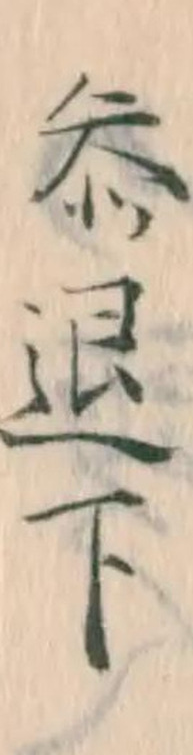参退下
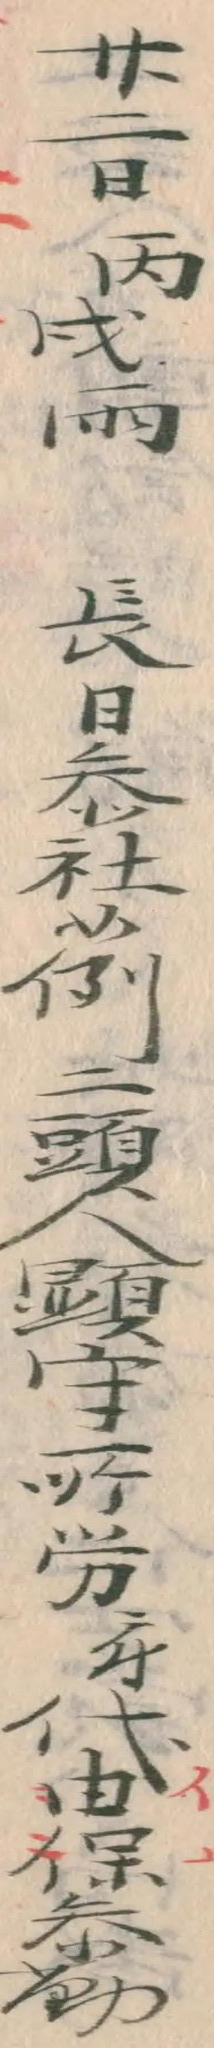廿二日丙戌雨長日参社如例二頭人顕守所労ニ付代由保参勤
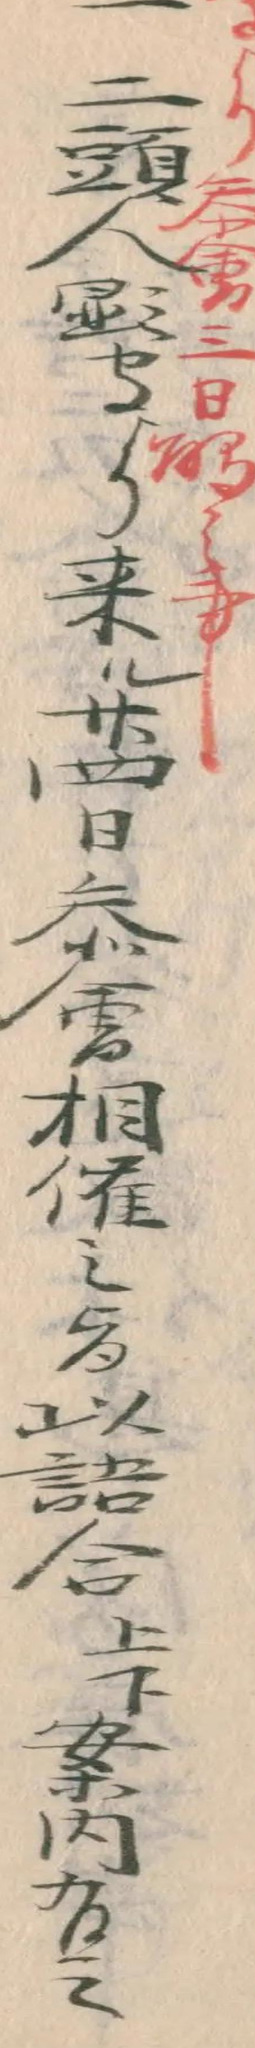一二頭人顕守より来ル廿四日参會相催之旨以詰合上下案内有之
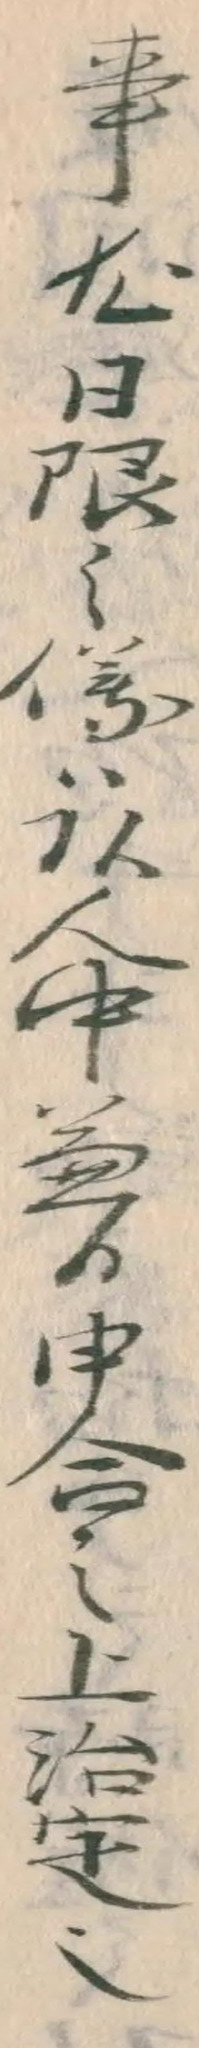事尤日限之儀ハ頭人中兼日申合之上治定也
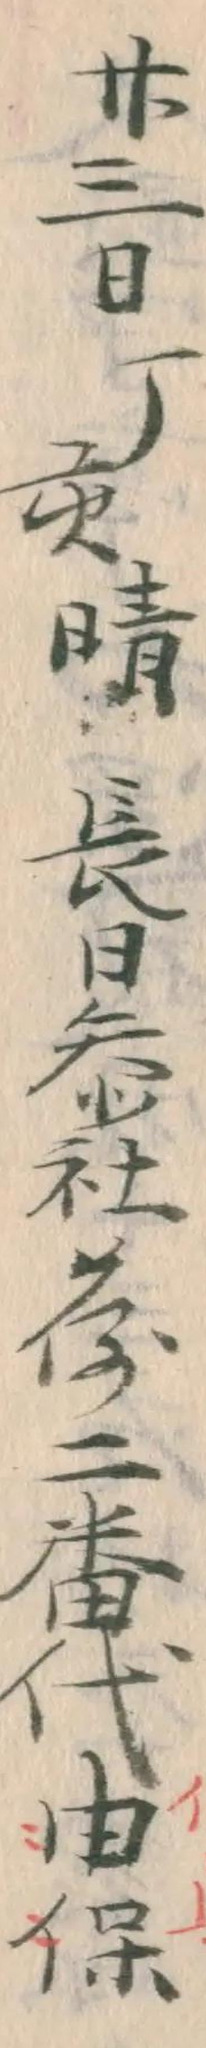廿三日丁亥晴長日参社如例二番代由保
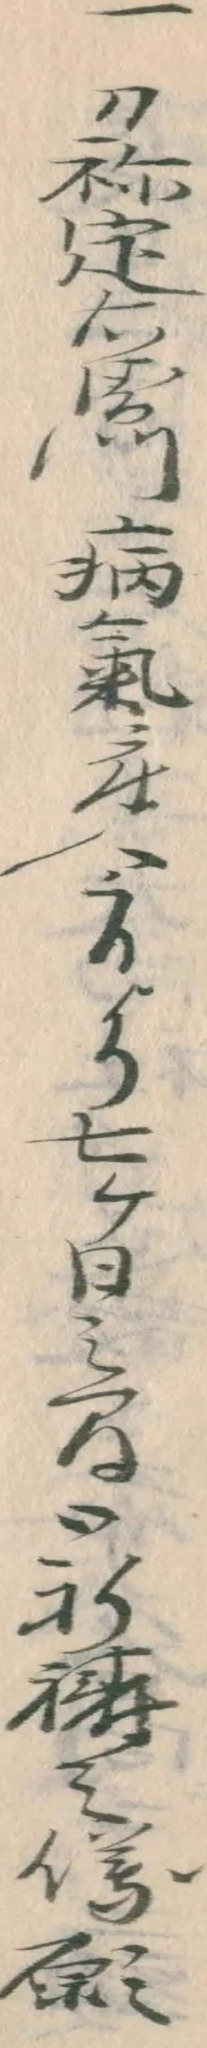一刀称定右衛門病氣ニ付今日より七ケ日之間御祈祷之儀願
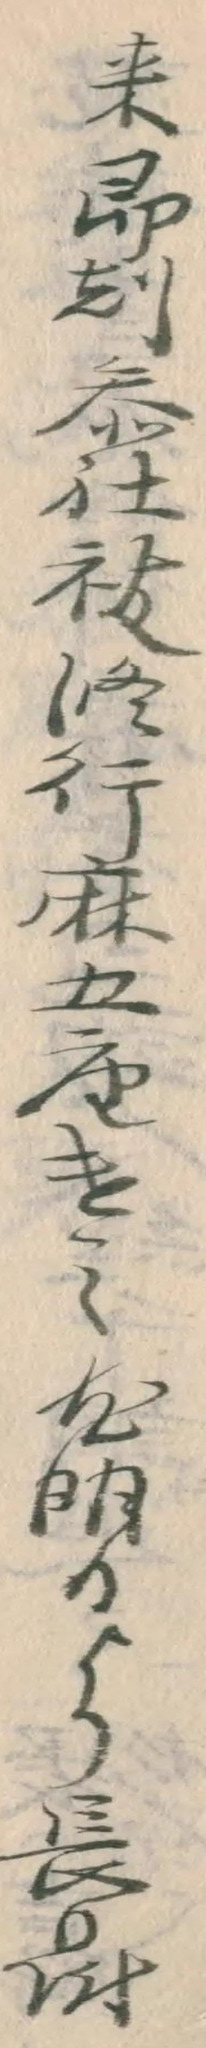来即刻参社祓修行麻五座遣之尤明日より長日附
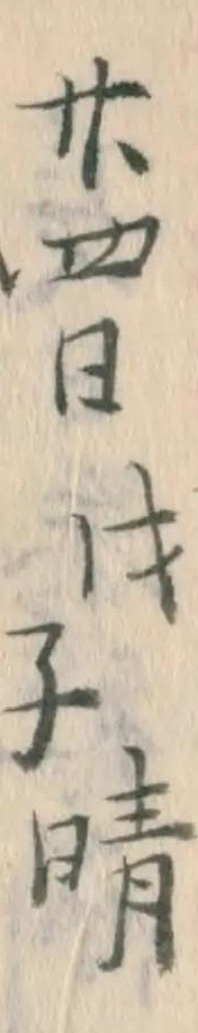廿四日戊子晴

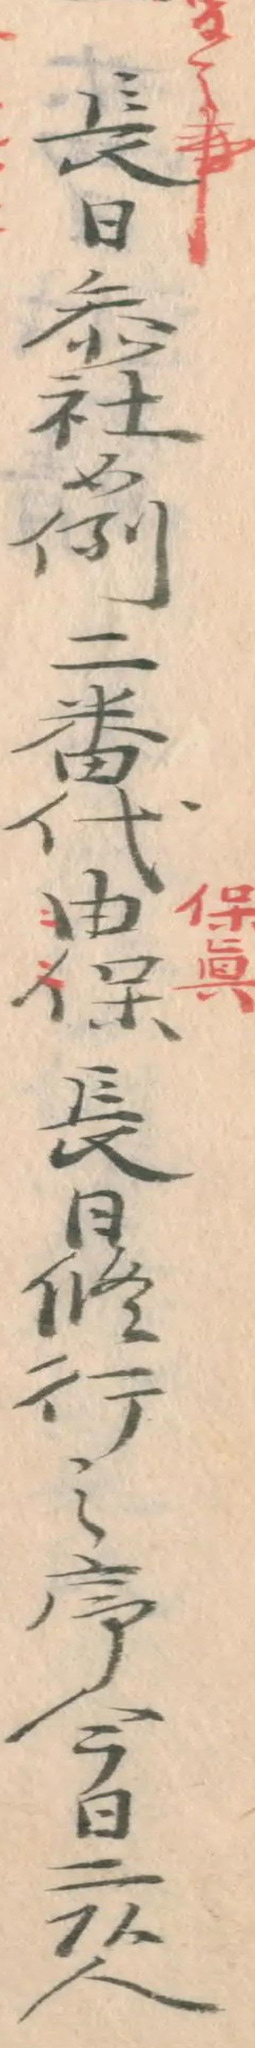一長日参社如例二番代由保長日修行之序今日二頭人
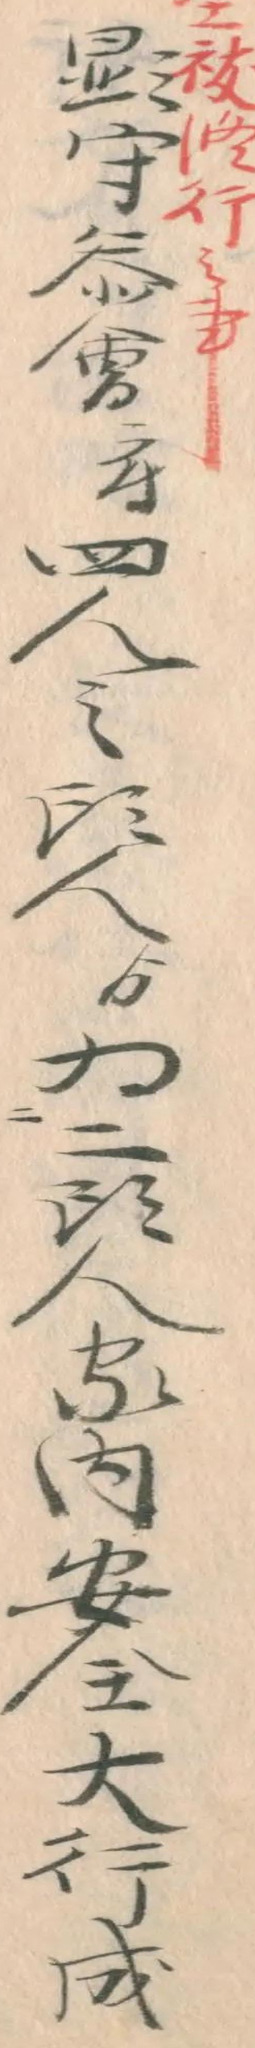顕守参會ニ付四人之頭人ゟ為二頭人家内安全大行成
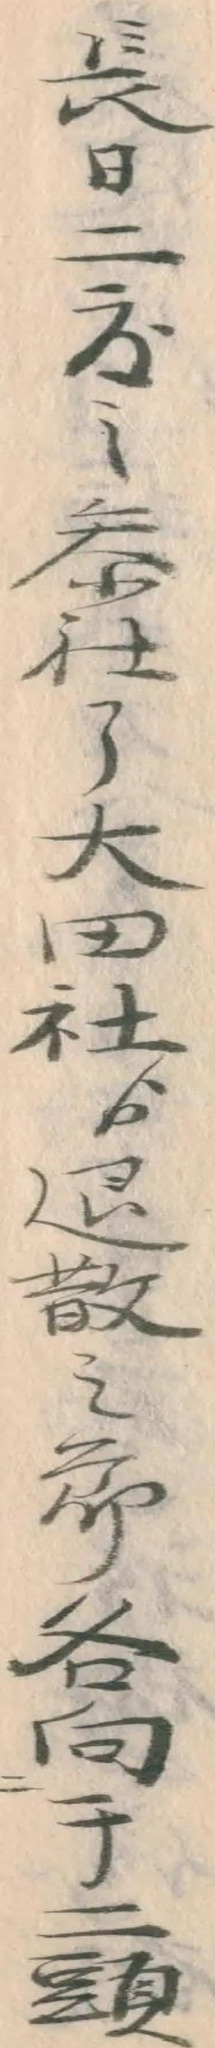長日二度之参社了大田社ゟ退散之節各向于二頭
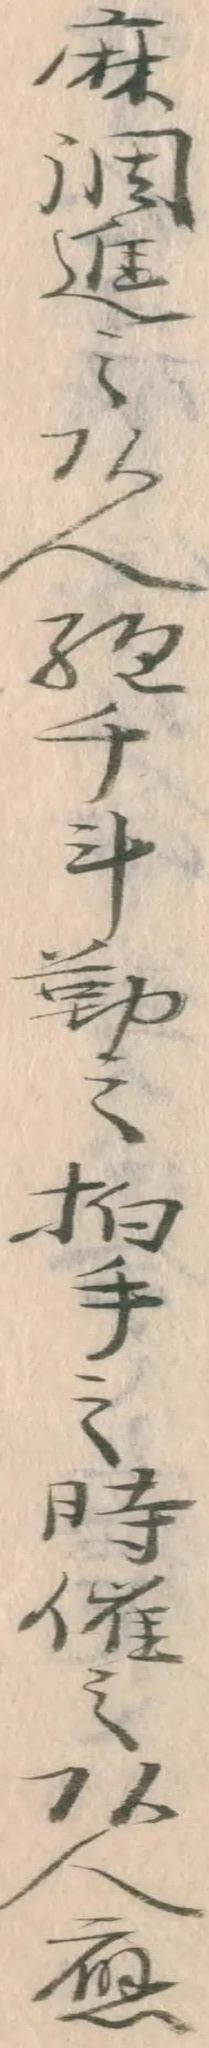麻調進之頭人経千斗勤之拍手之時催之頭人應
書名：賀茂社記録. 第73冊
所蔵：国立国会図書館 National Diet Library, JAPAN
